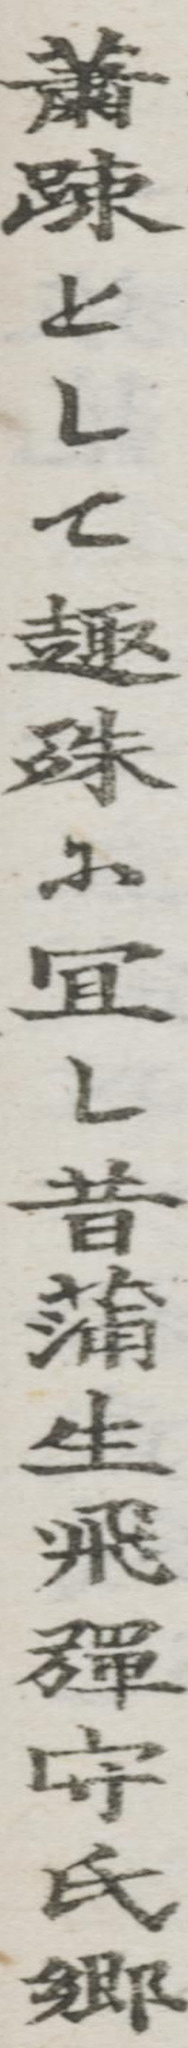蕭疎として趣殊に冝し昔蒲生飛騨守氏郷
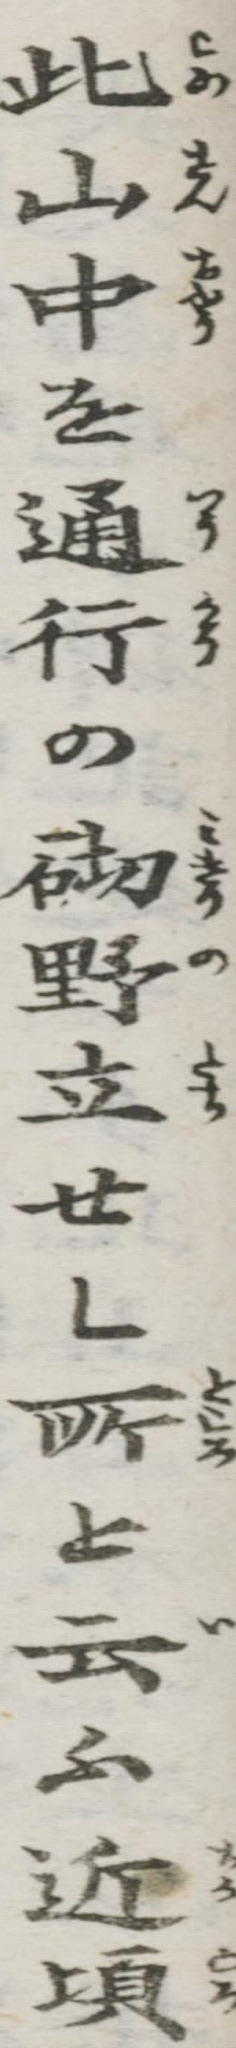此山中を通行の砌野立せし所と云ふ近頃
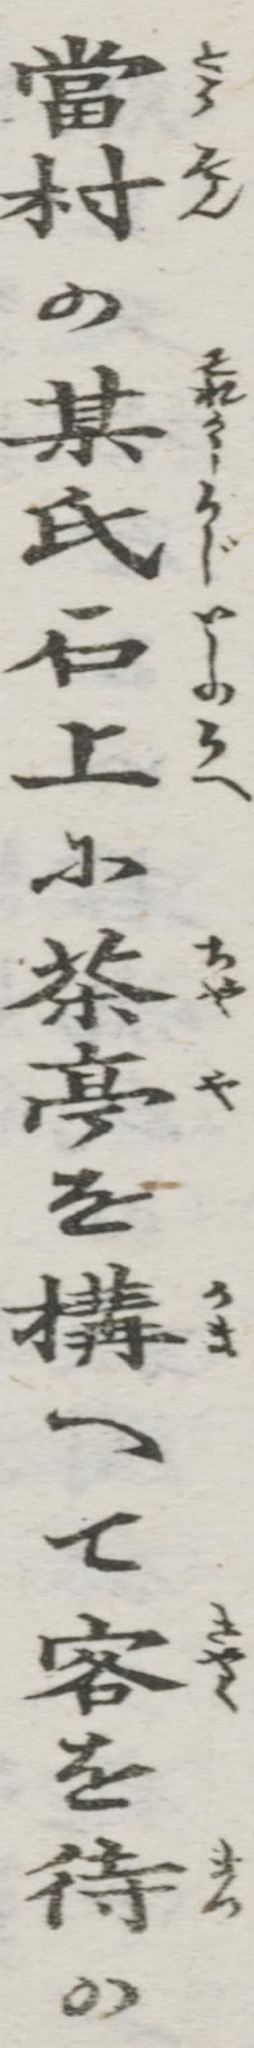當村の某氏石上に茶亭を構へて客を待の
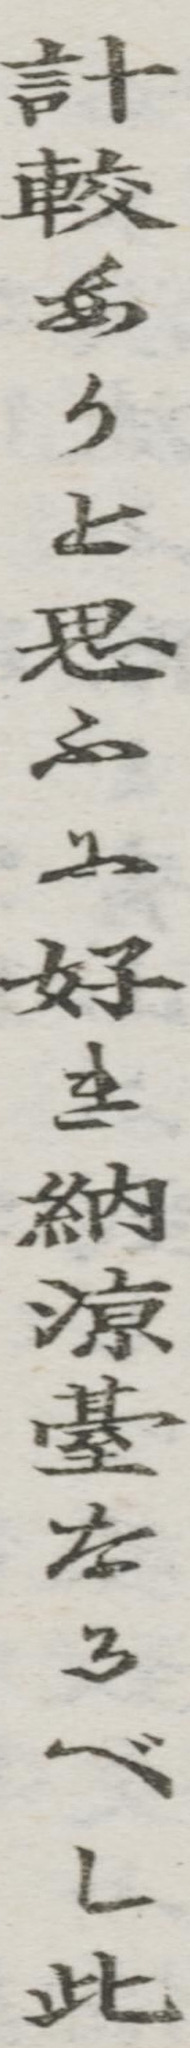計較ありと思ふに好き納涼臺なるべし此
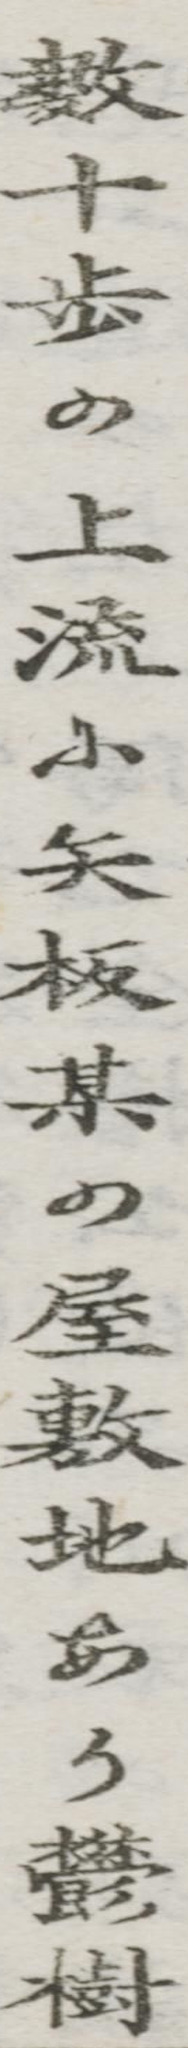数十歩の上流に矢板某の屋敷地あり鬱樹
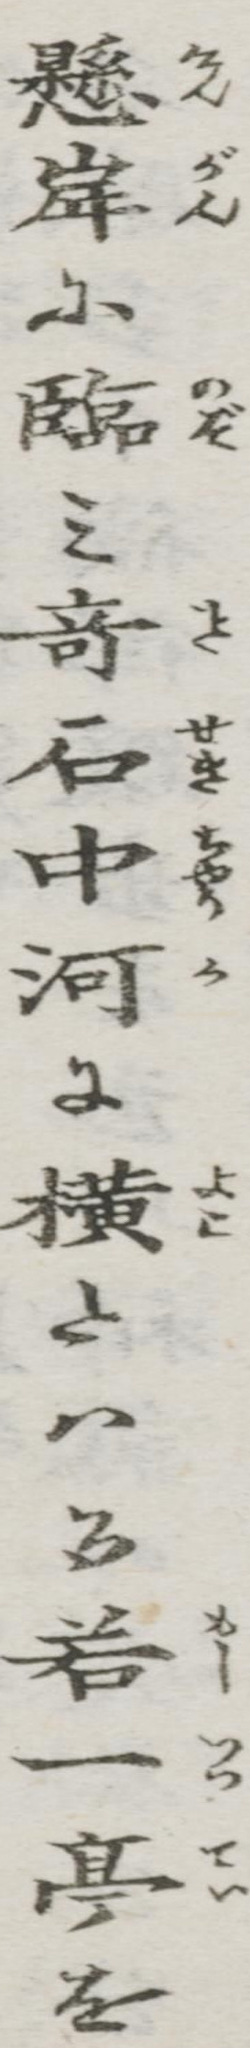懸岸に臨み奇石中河に横たはる若一亭を
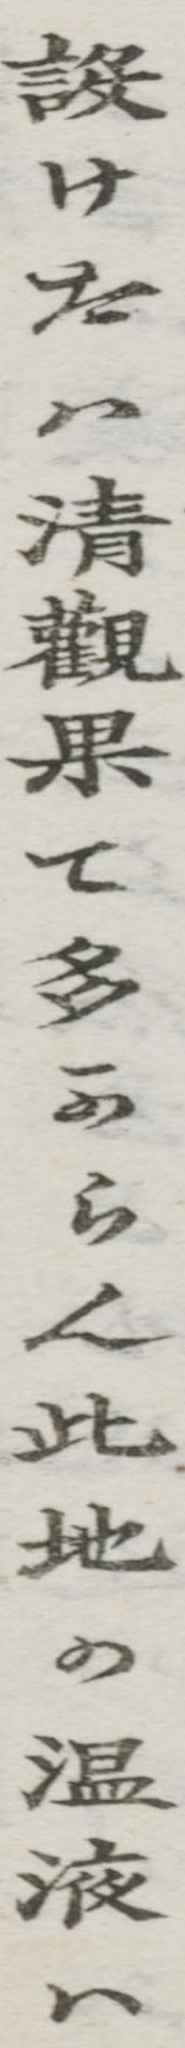設けたは清観果て多からん此地の温液は
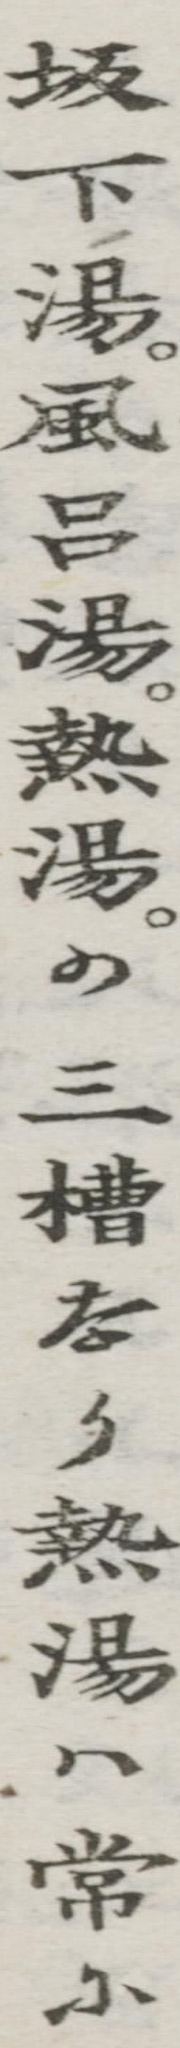坂下湯。風呂湯。熱湯。の三槽なり熱湯は常に
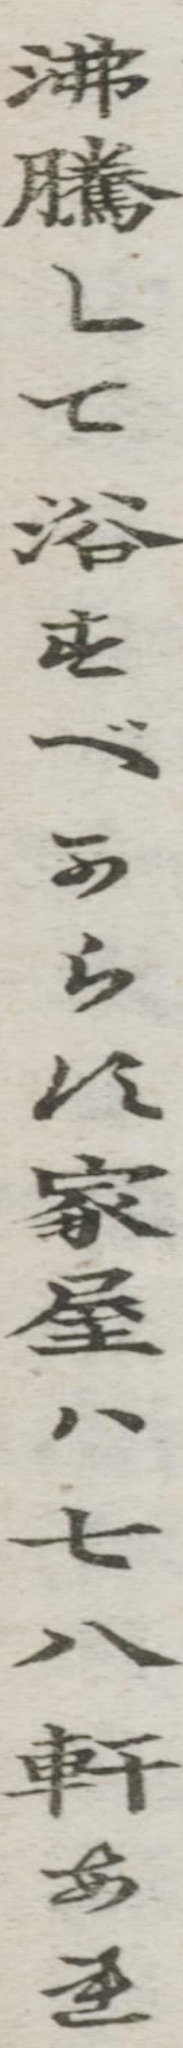沸騰して浴すべからす家屋は七八軒あれ

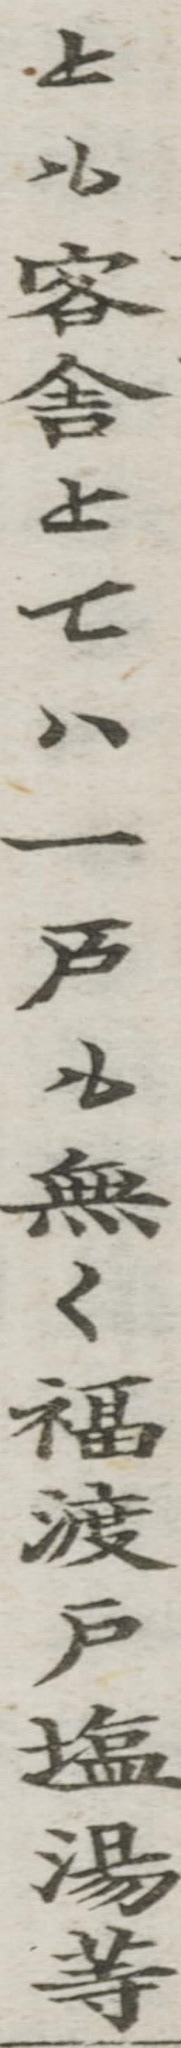とも客舎とては一戸も無く福渡戸塩湯等
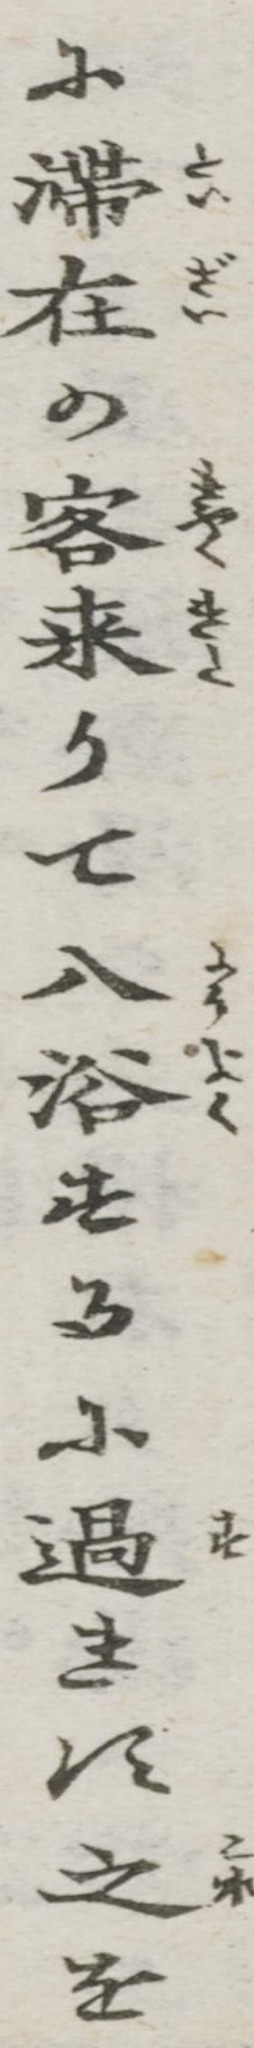に滞在の客来りて入浴するに過きす之を
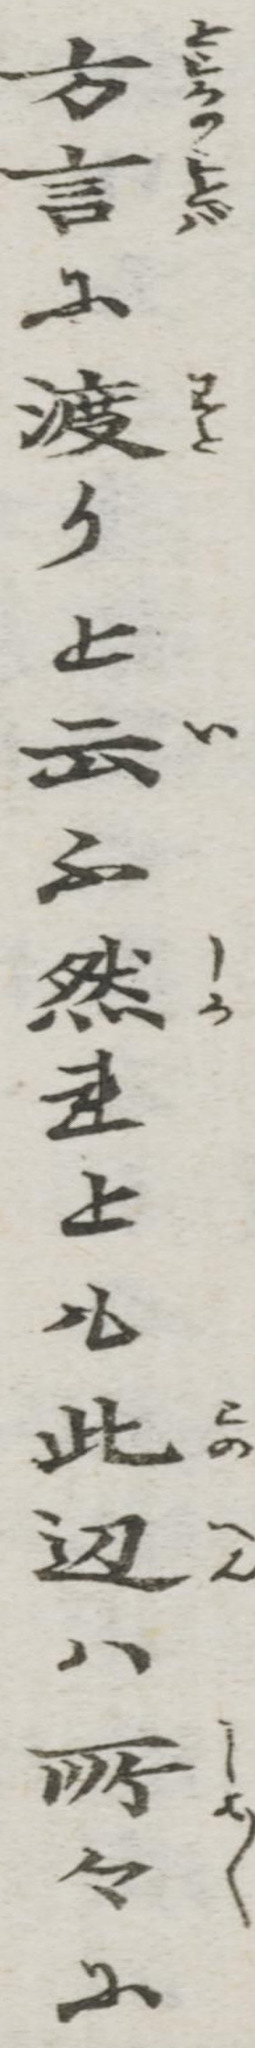方言に渡りと云ふ然れとも此辺は所々に
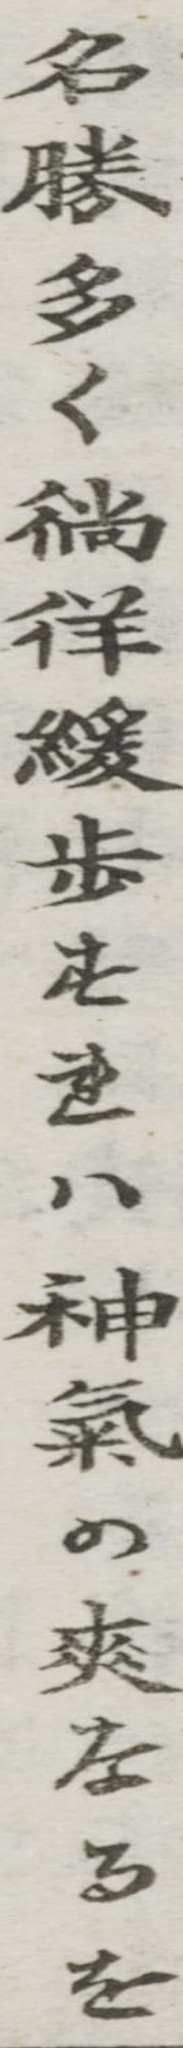名勝多く徜徉緩歩すれは神氣の爽なるを
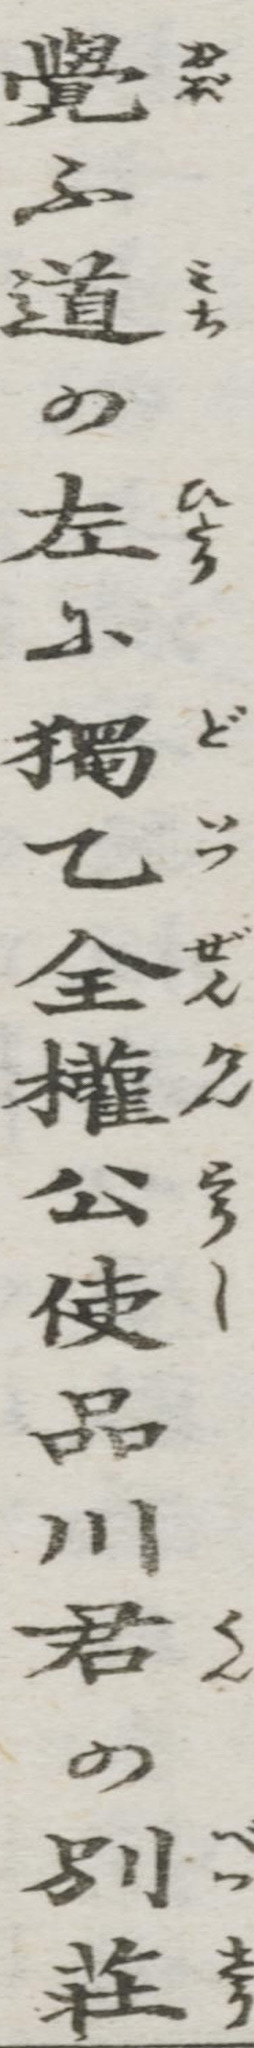覚ふ道の左に獨乙全権公使品川君の別荘
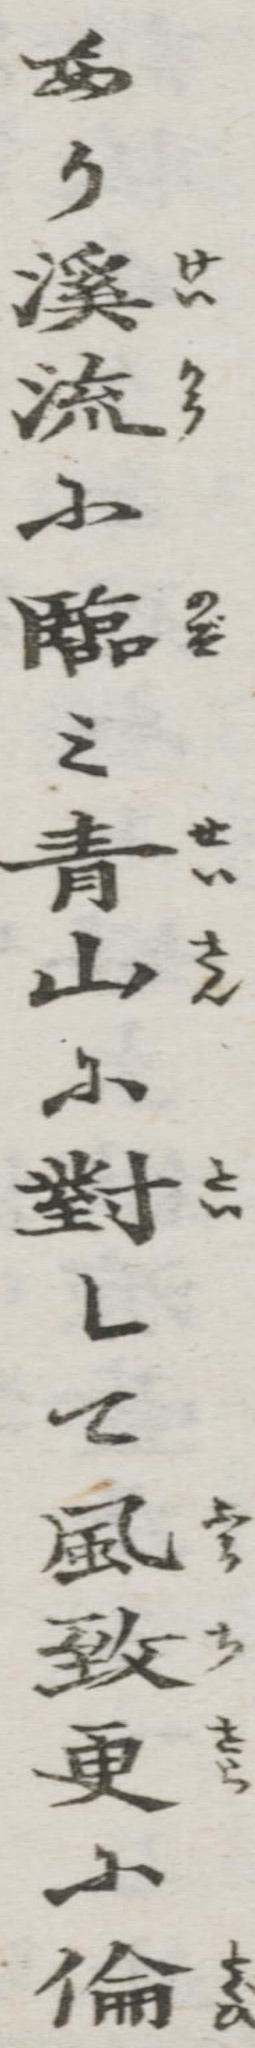あり渓流に臨み青山に對して風致更に倫
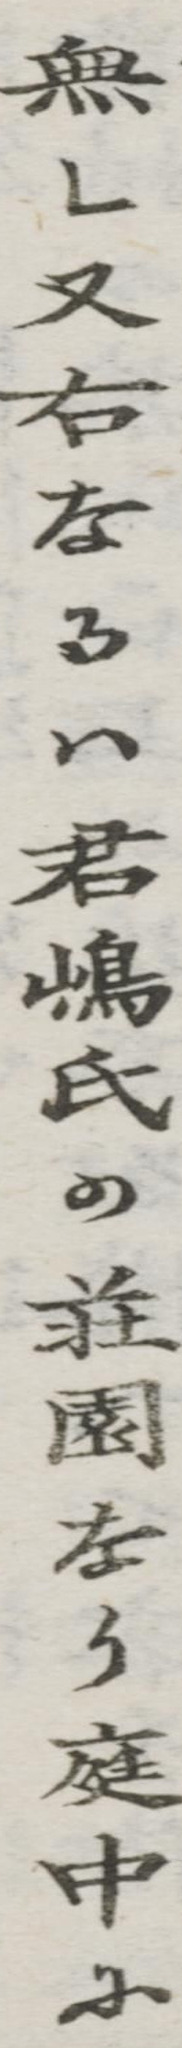無し又右なるは君嶋氏の荘園なり庭中に
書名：塩原繁昌記　全
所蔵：東京大学地震研究所図書室 Earthquake Research Institute Library, The University of Tokyo, JAPAN
